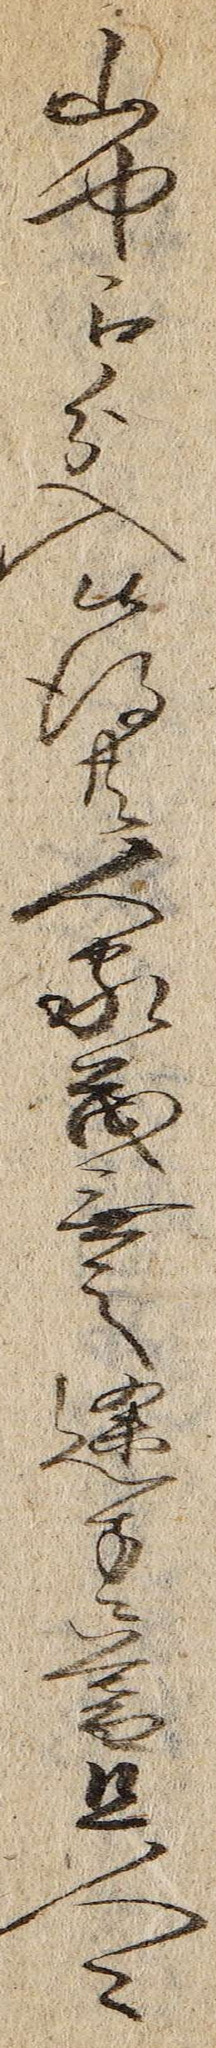山中へ分入候得ども人家も無之途方に暮且人々
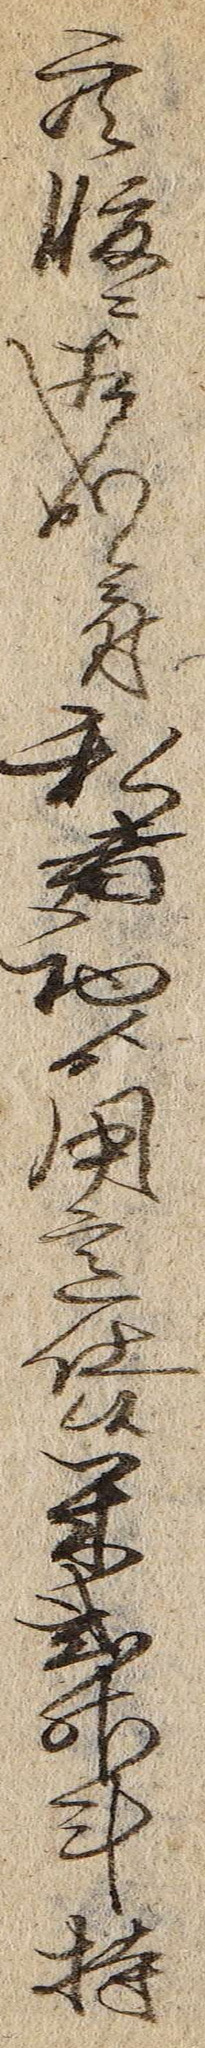空腹に相成候に付私は初より用意仕候米二升斗持
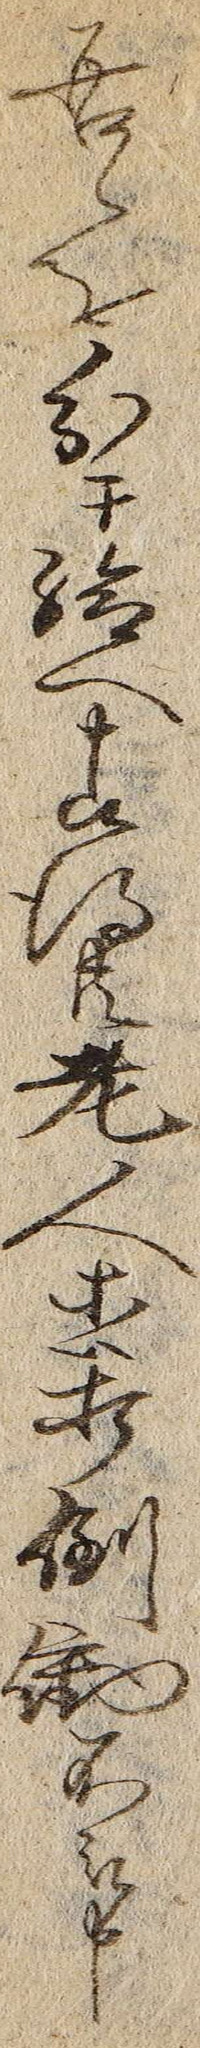居候を分て給へ申候得ども老人等は打倒働不被申
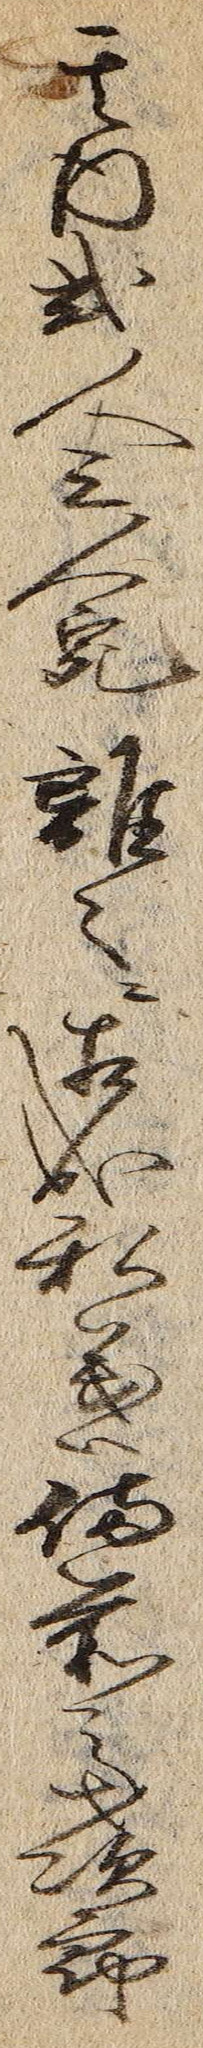其内二人三人宛離々に相成私義は備前の才次郎
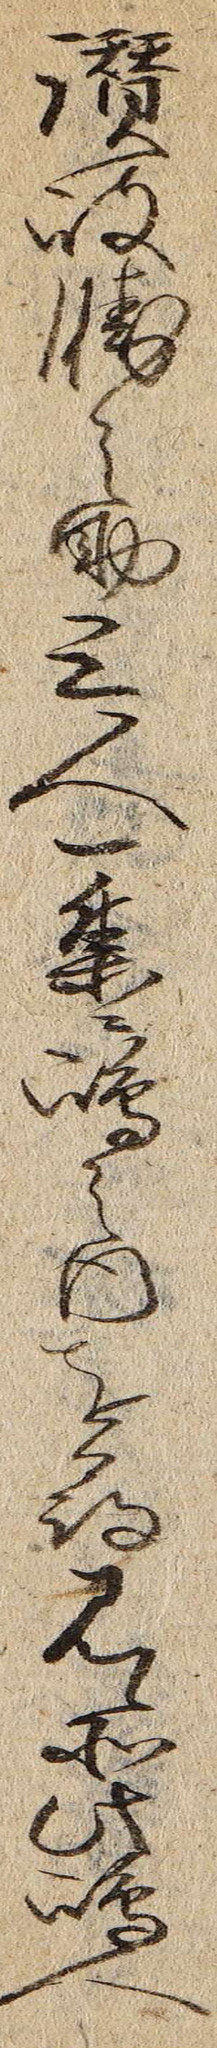讃岐勝之助三人一集に島の内を尋見候所此島人
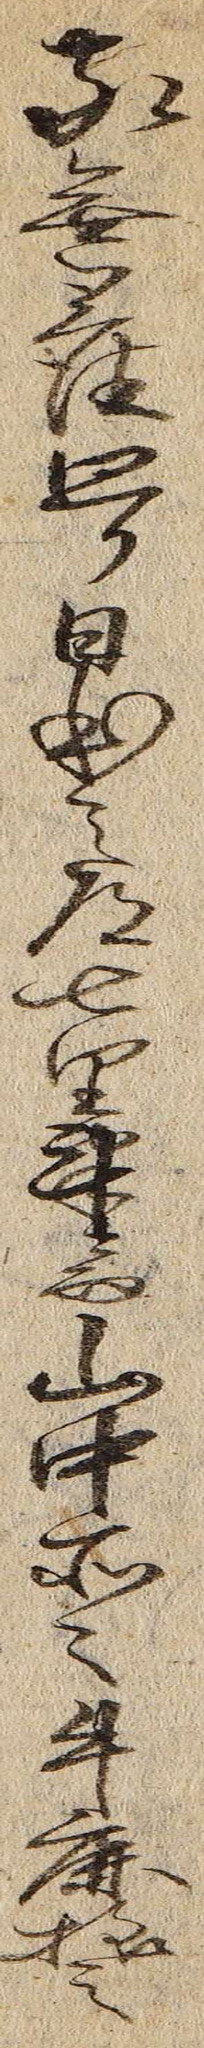家無御座廻り日本の道七里斗にて山中所々牛鹿様の
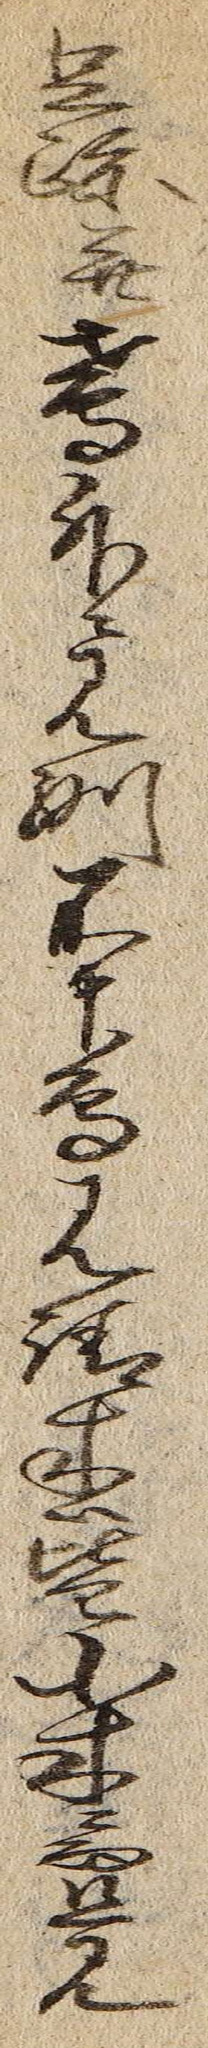足跡幷鳶外に見馴不申鳥見請木は皆小木にて且見
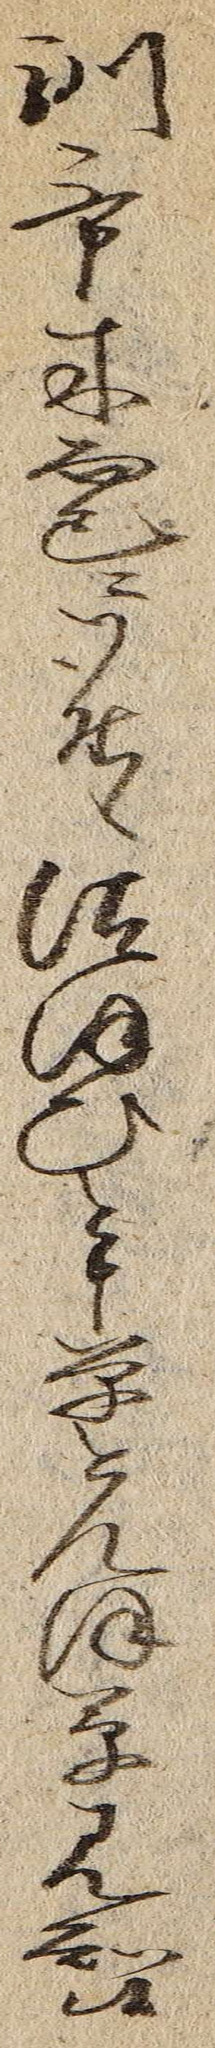馴不申木而已に御座候つほひと申草とんほ草見知候
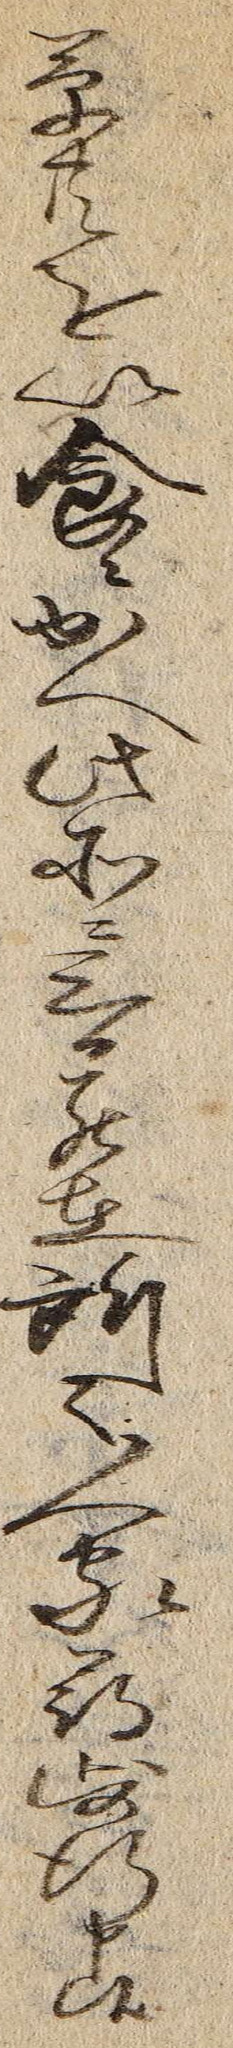草どもを以食にかへ此所に三日罷在所々人家尋歩行申候
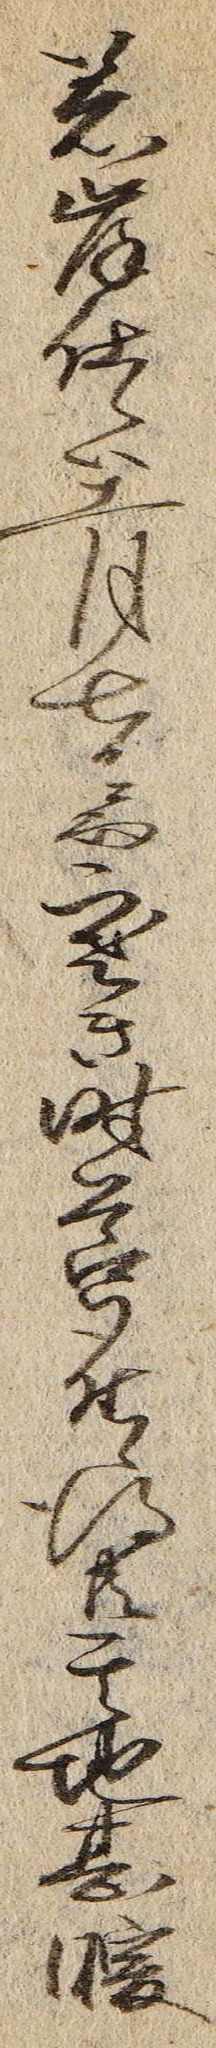着岸仕候は十一月七日にて寒き時節御座候得ども其地甚暖
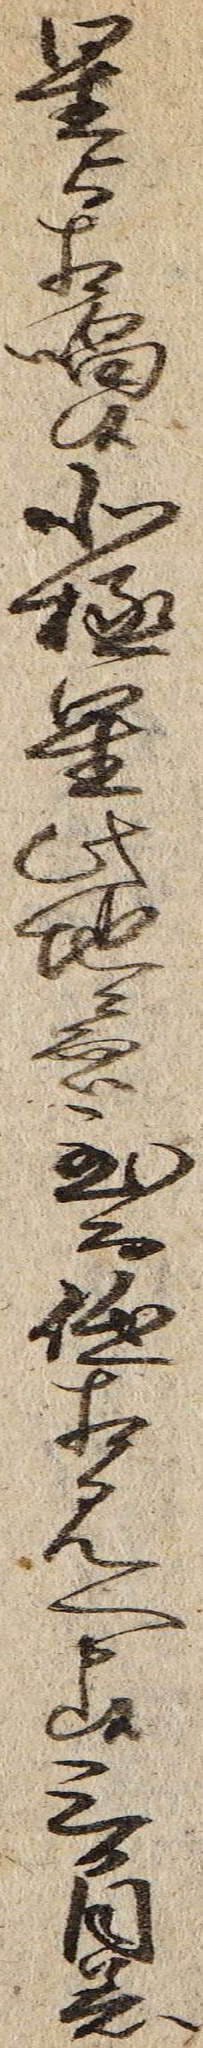星と相唱候北極星此地にては至て低相見へ申候三日目着
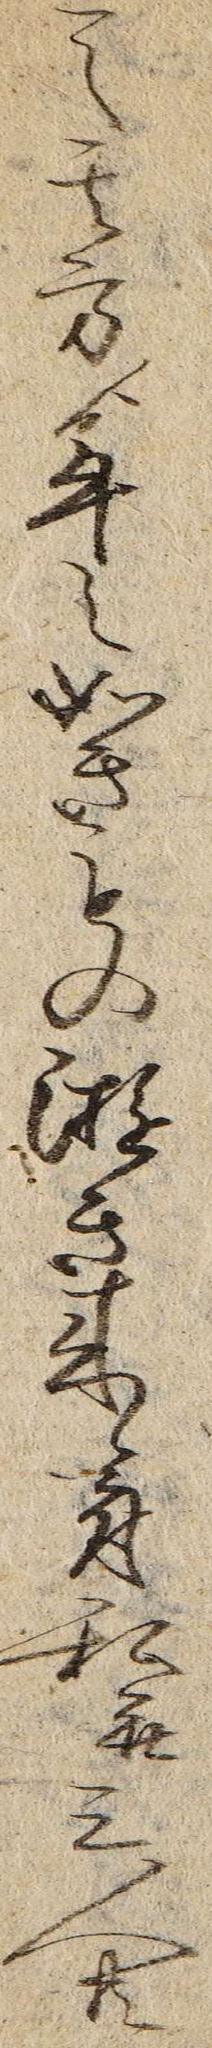之其方より牛の如きもの泳き来候に付私幷三人とも
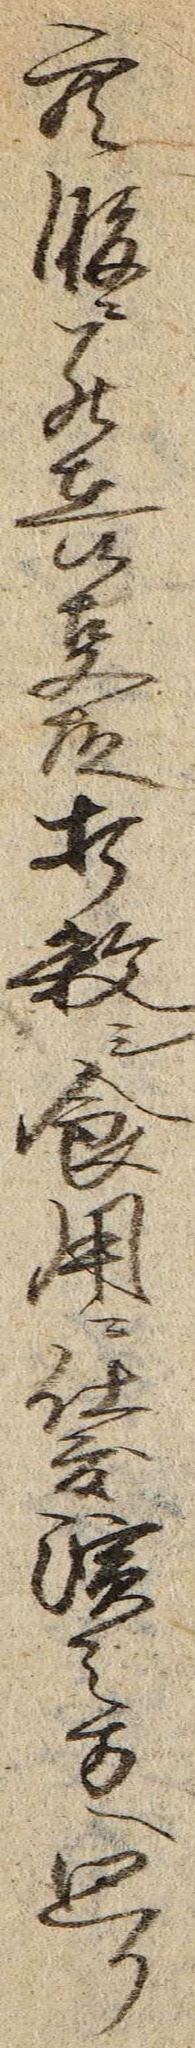空腹に罷在候事故打殺食用に仕度浜の方へ廻り
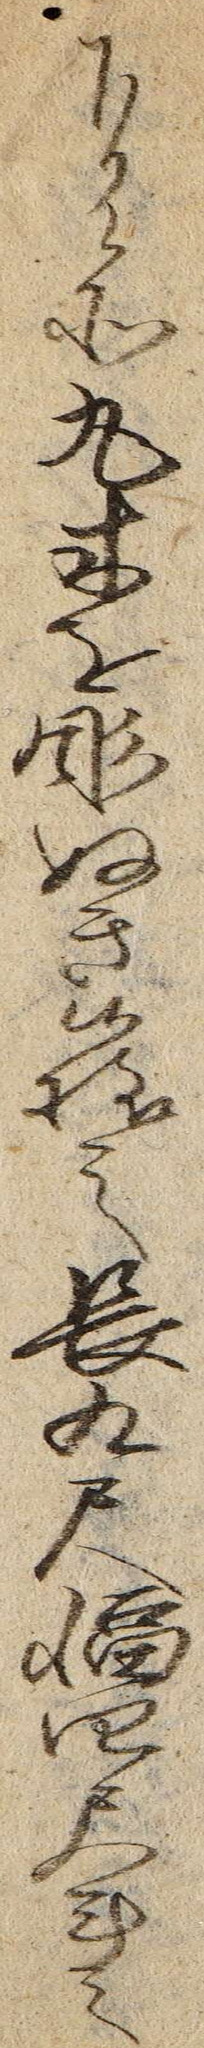下り候所丸木を彫ぬき候様の長九尺幅四尺斗の

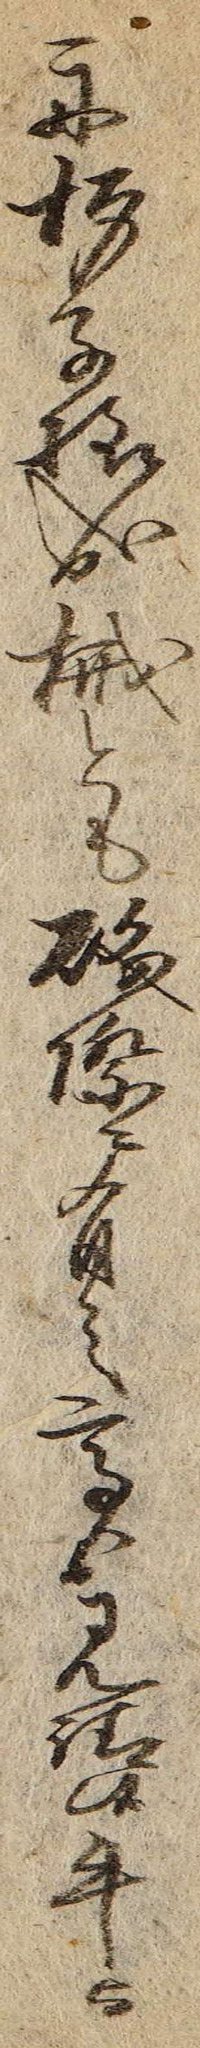舟板子様成械とも磯際に有之高より見請候牛と
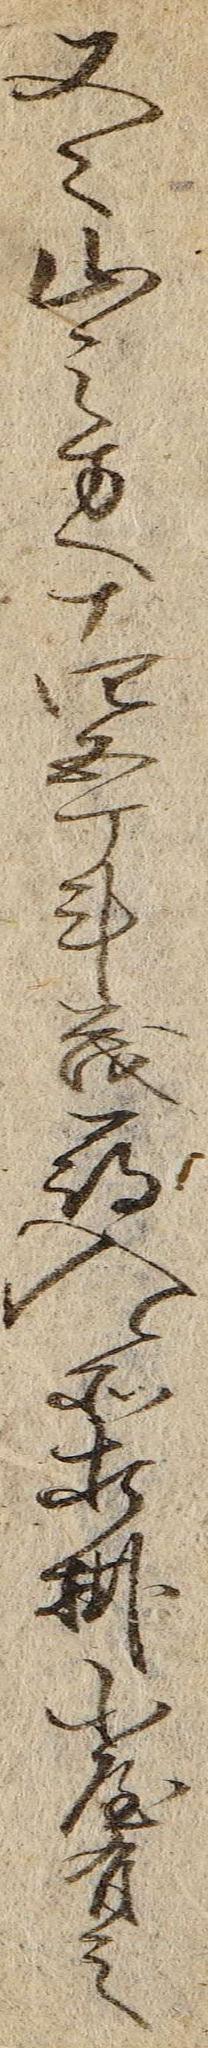又々山の方へ十四五丁斗も尋入候所打掛小屋有之
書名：能登国清兵衛異国江漂流之始末
